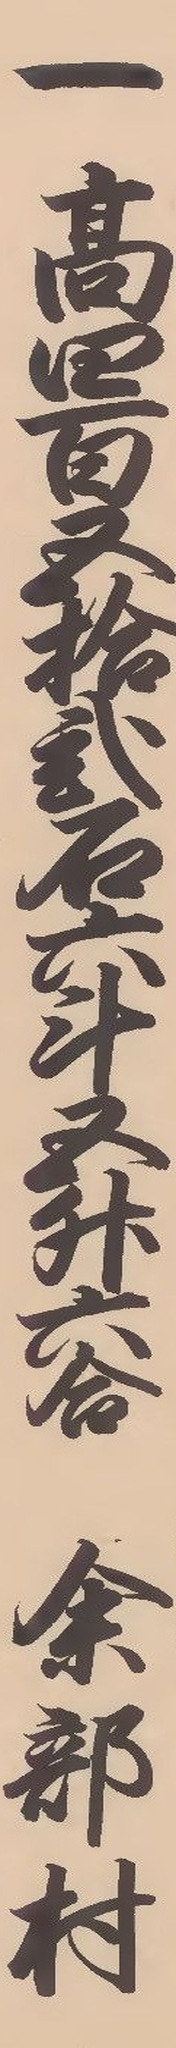一高四百五拾弐石六斗五升六合余部村
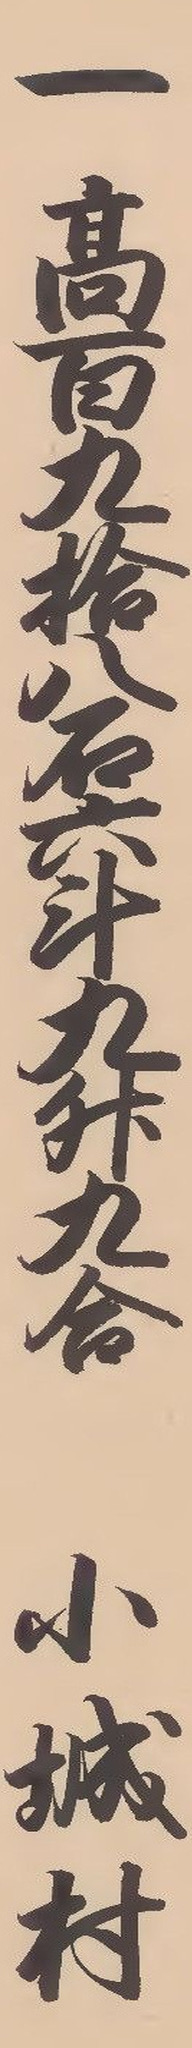一高百九拾八石六斗九升九合小城村
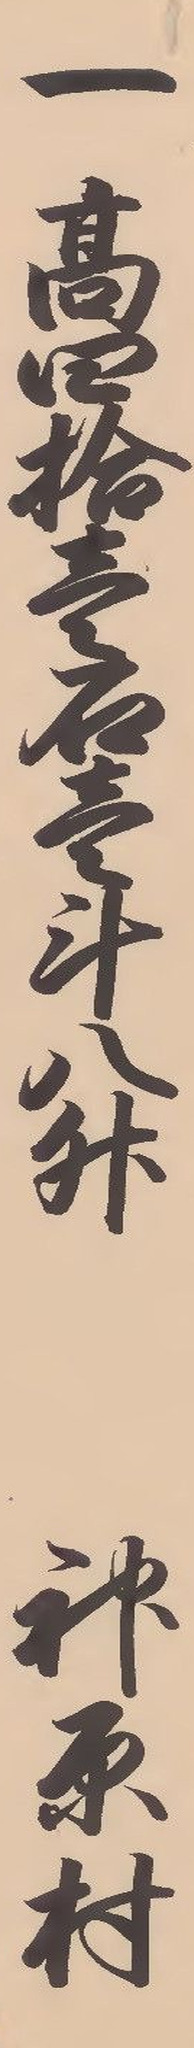一高四拾壱石壱斗八升神原村
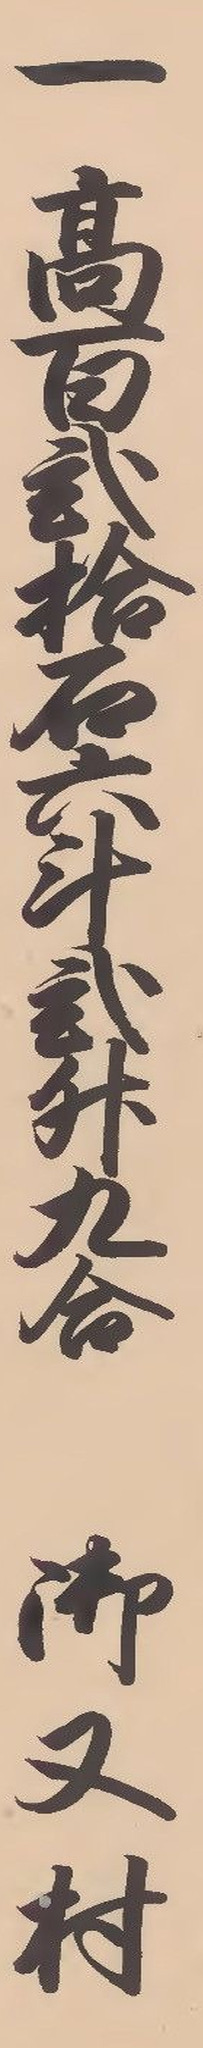一高百弐拾石六斗弐升九合御又村
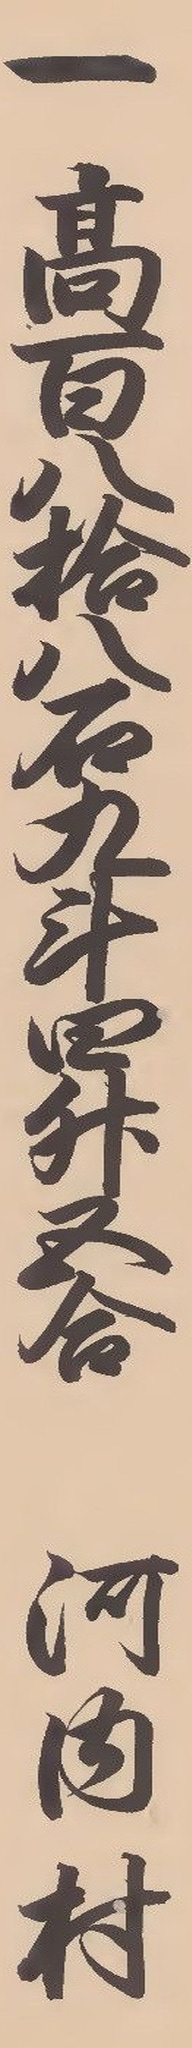一高百八拾八石九斗四升五合河内村
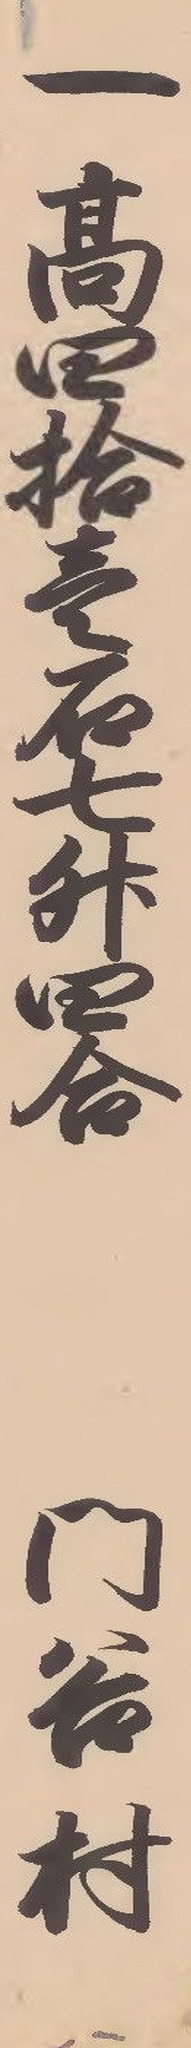一高四拾壱石七升四合門谷村
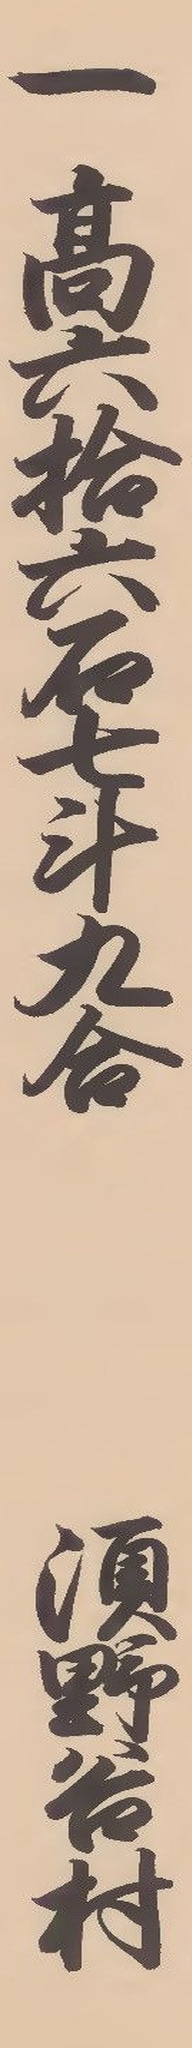一高六拾六石七斗九合湏野谷村
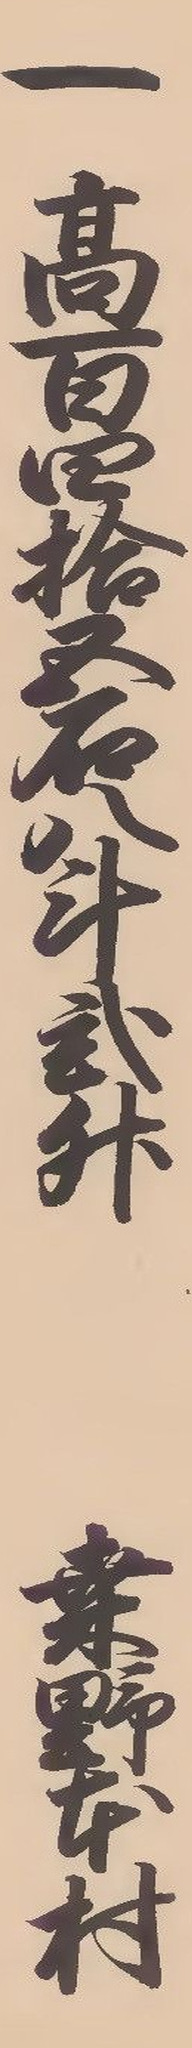一高百四拾五石八斗弐升桒野本村

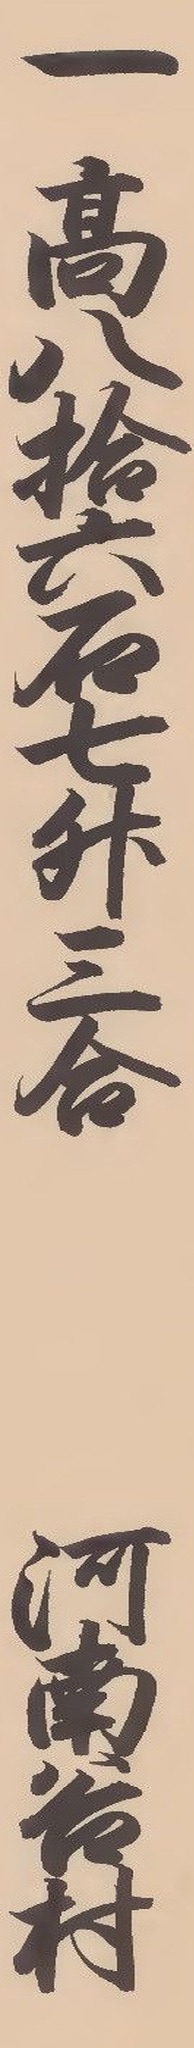一高八拾六石七升三合河南谷村
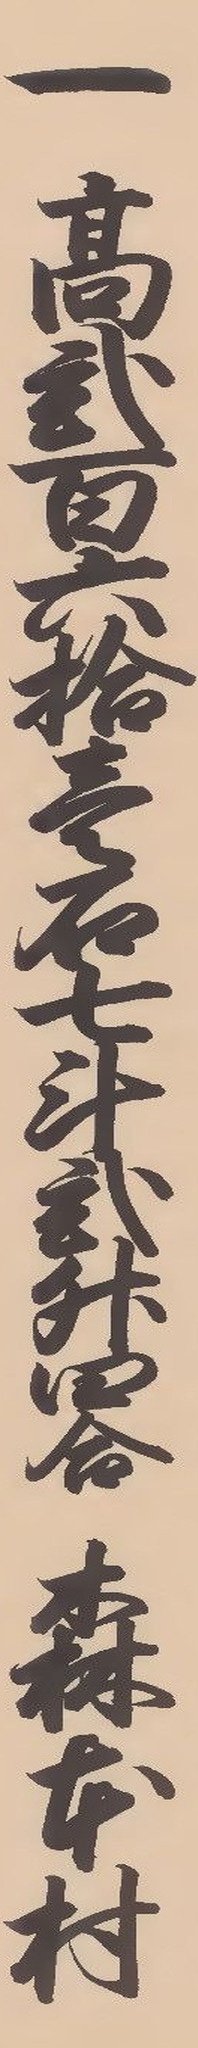一高弐百六拾壱石七斗弐升四合森本村
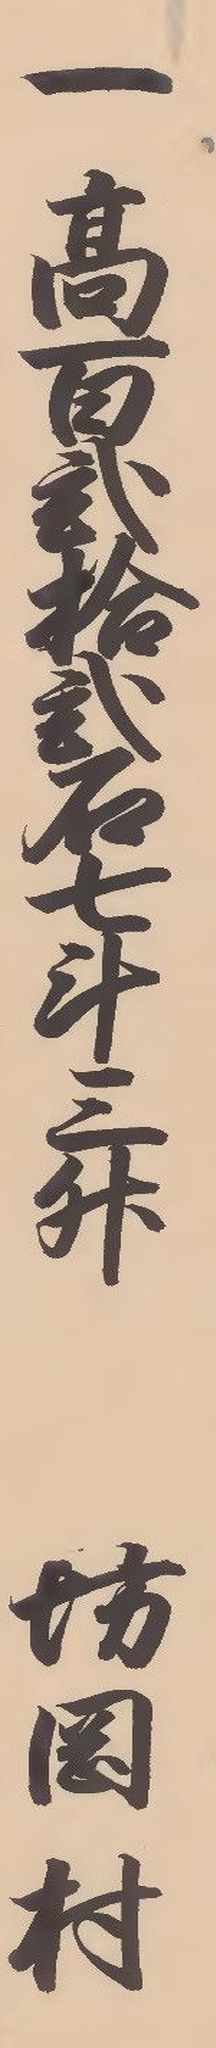一高百弐拾弐石七斗三升坊岡村
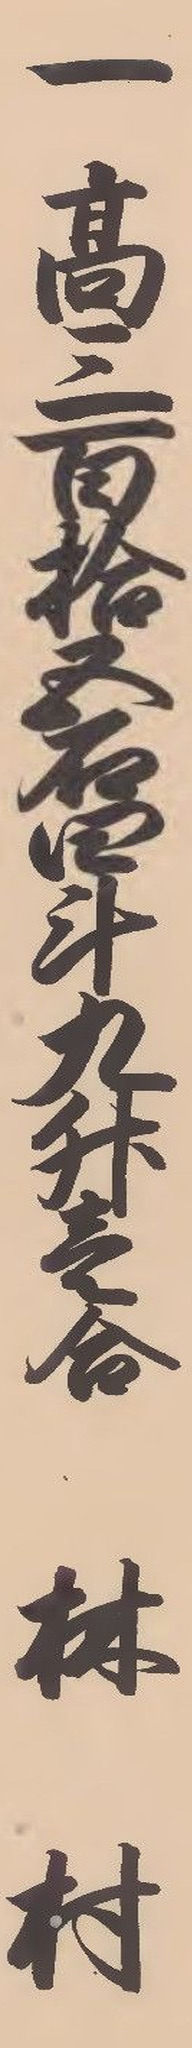一高三百拾五石四斗九升壱合林村
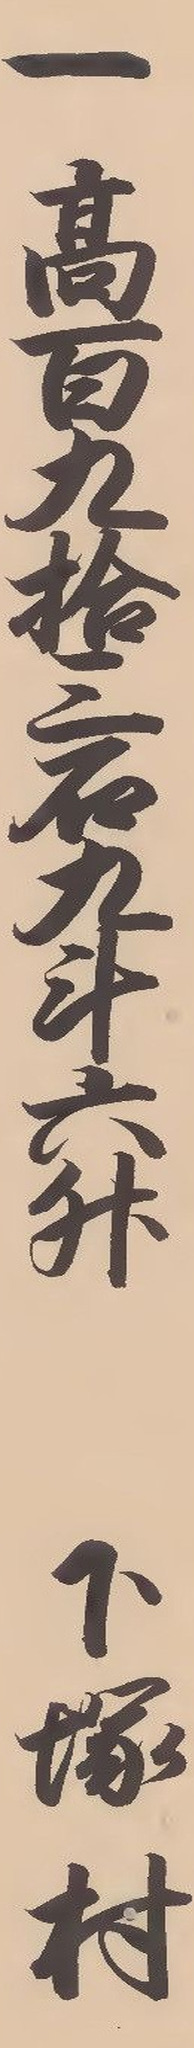一高百九拾三石九斗六升下塚村
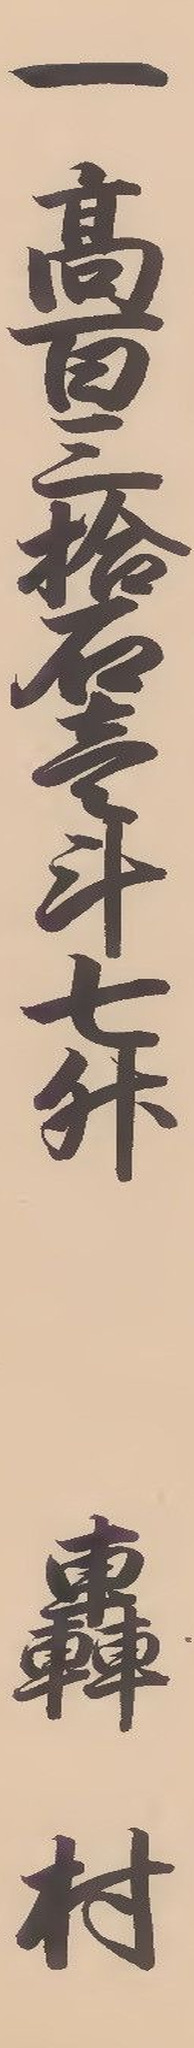一高百三拾石壱斗七升轟村

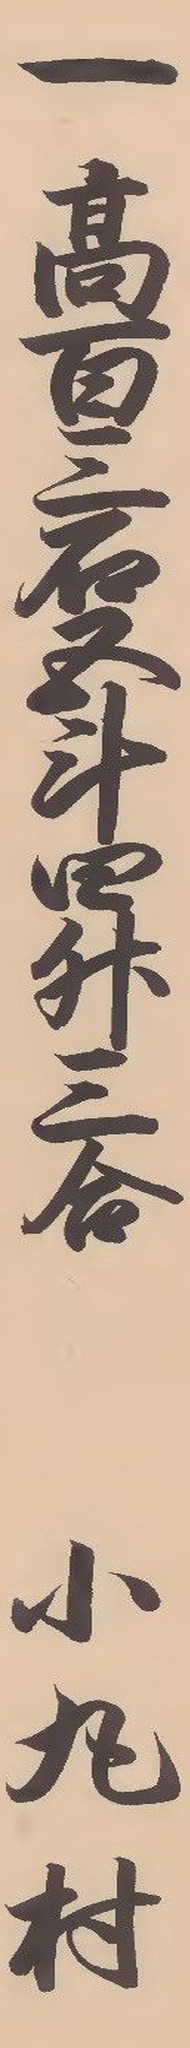一高百三石五斗四升三合小丸村
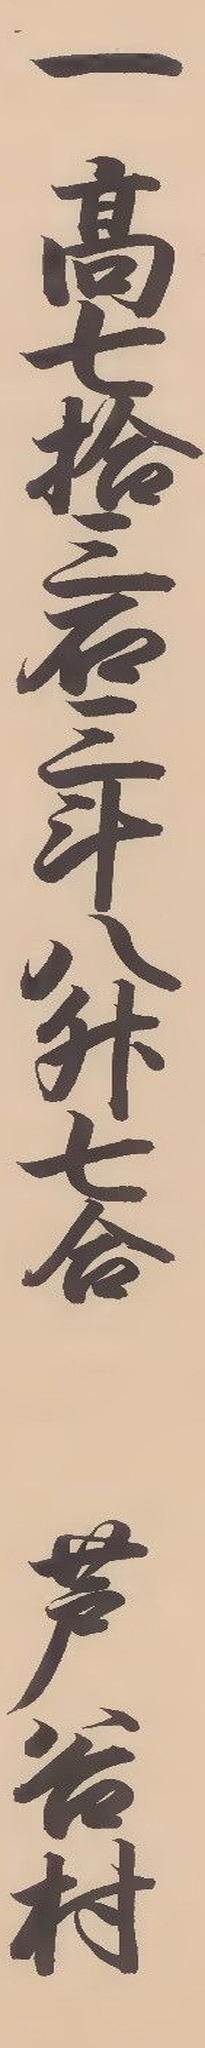一高七拾三石三斗八升七合芦谷村
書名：但馬国郷帳
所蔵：国立公文書館 National Archives of Japan
